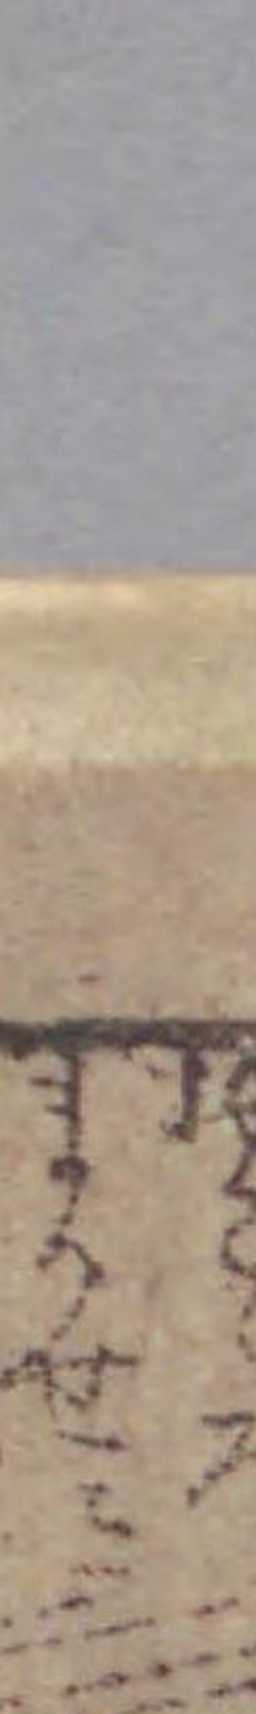まかせに
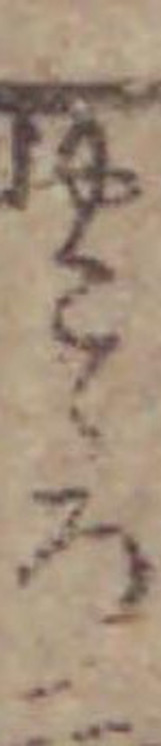おこゝろ
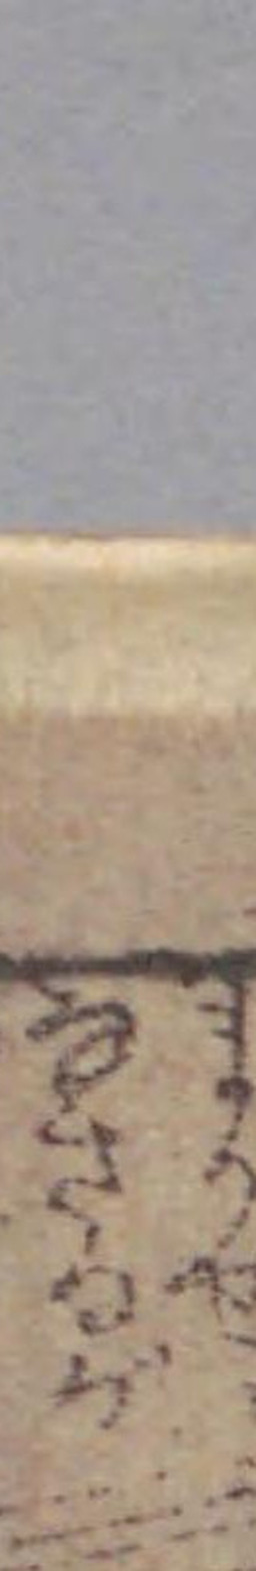なさるが
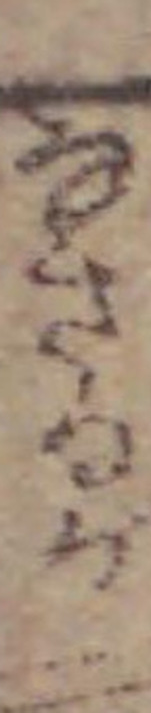なさるが
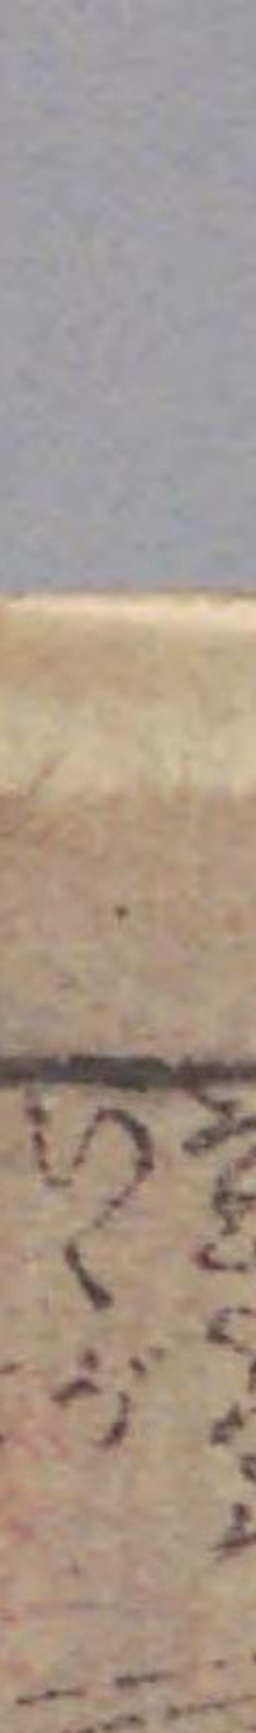いゝが
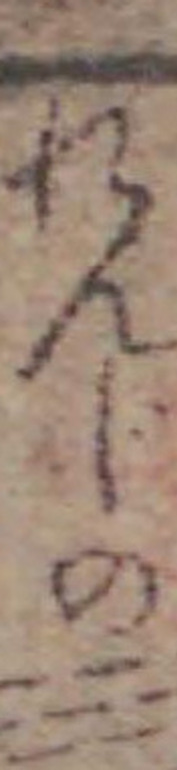れんじの
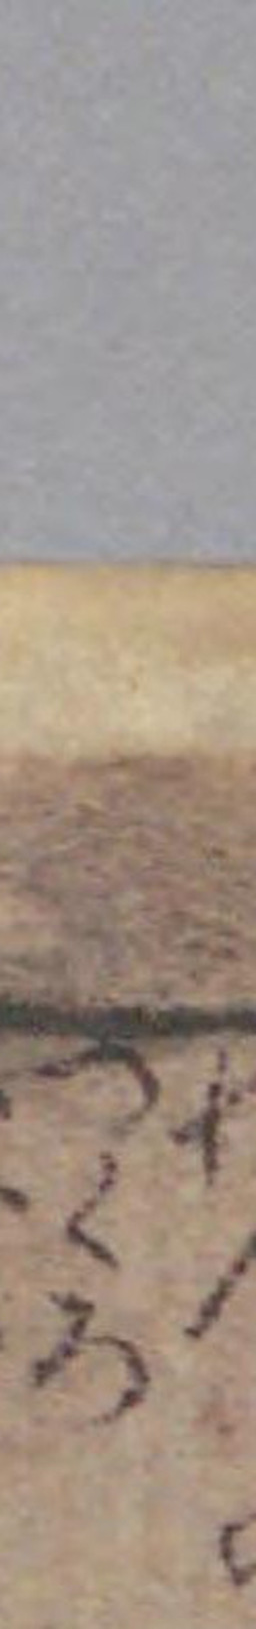つくろ
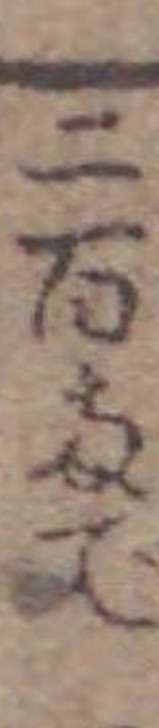二百両で

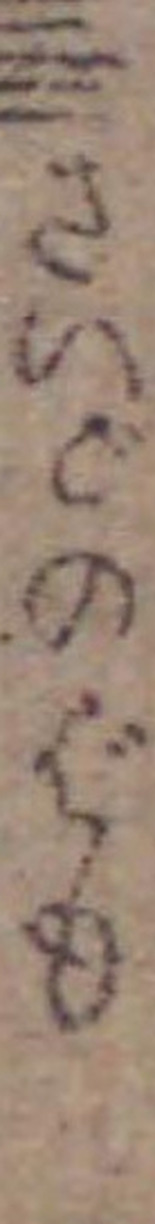さいごのばも
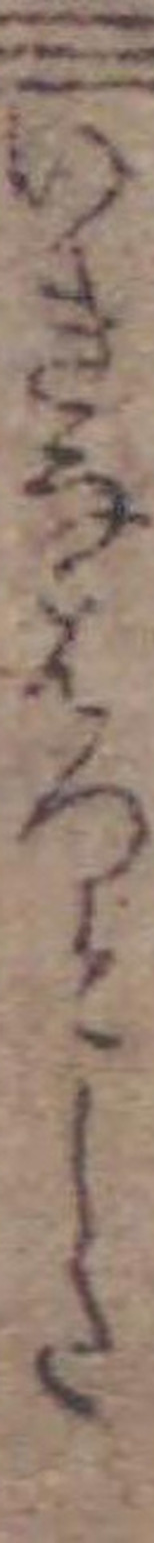いきなはつとした
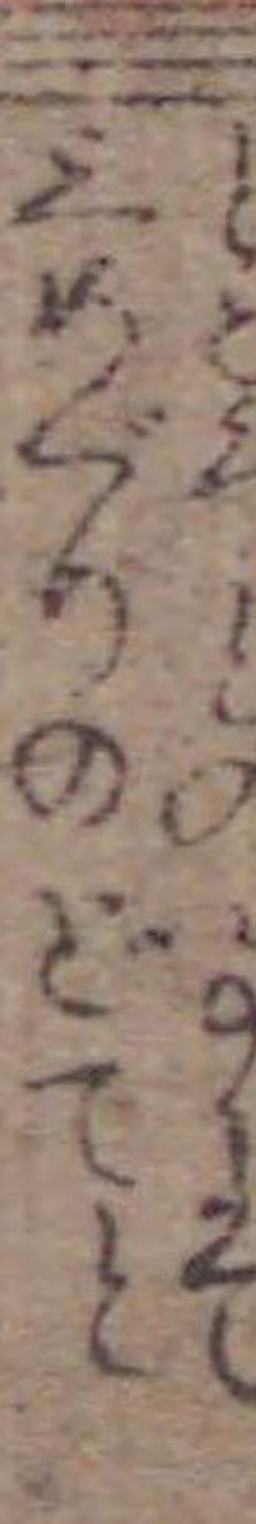三めぐりのどてと
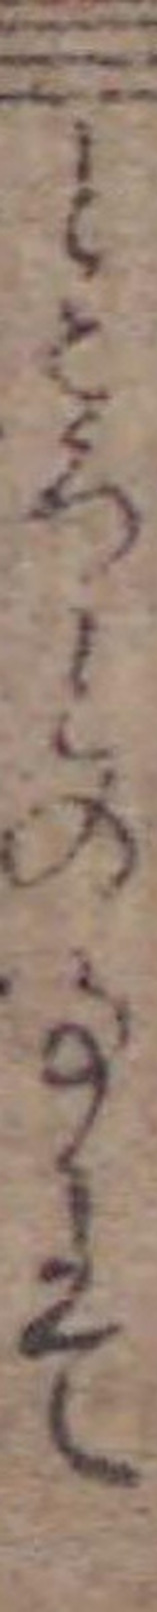ところとの事にて
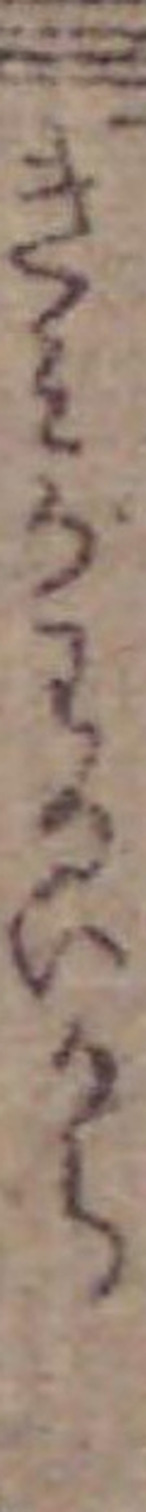きみがわるいから
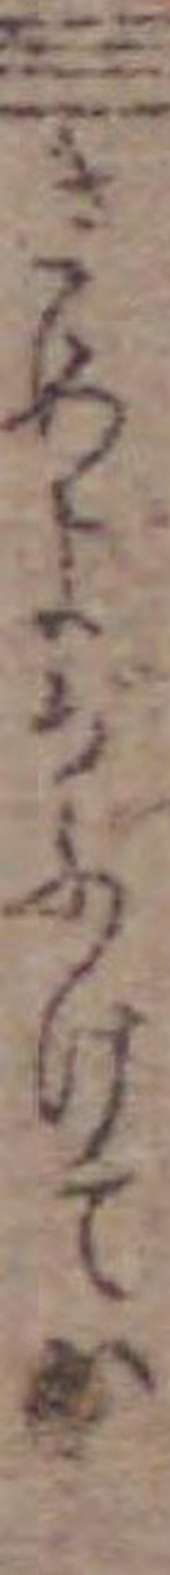きめよがふけては
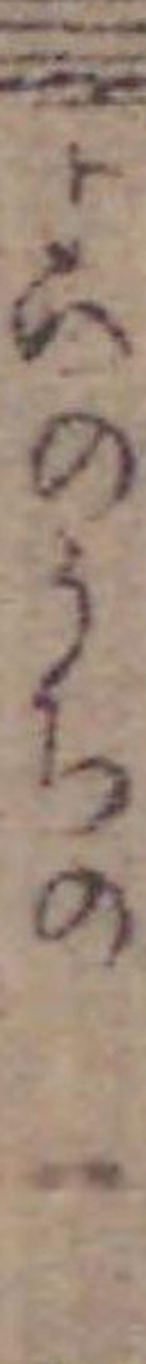よいのうちの
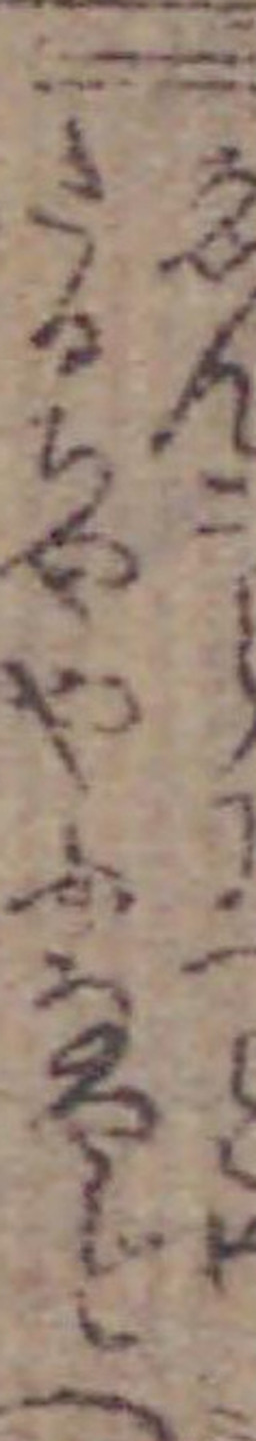たるちややふるやど
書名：江戸生艶気樺焼 : 3巻
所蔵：国立国会図書館 National Diet Library, JAPAN
